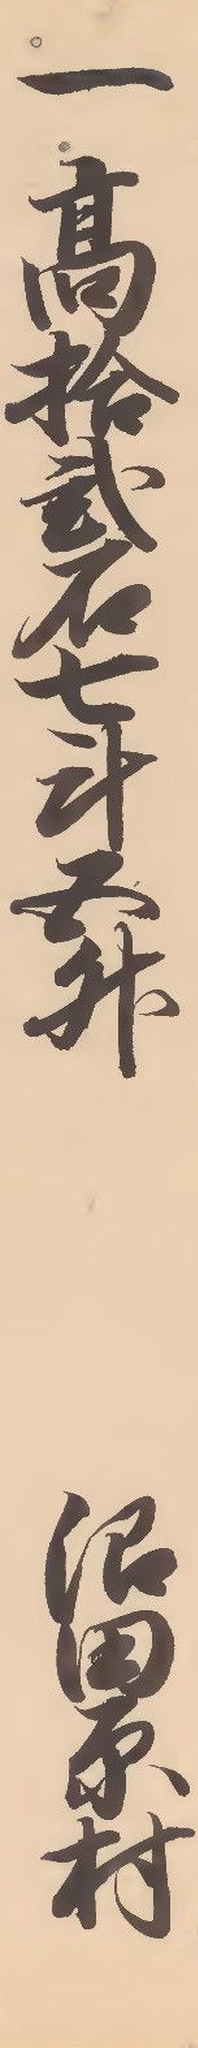一高拾弐石七斗五升沼田原村
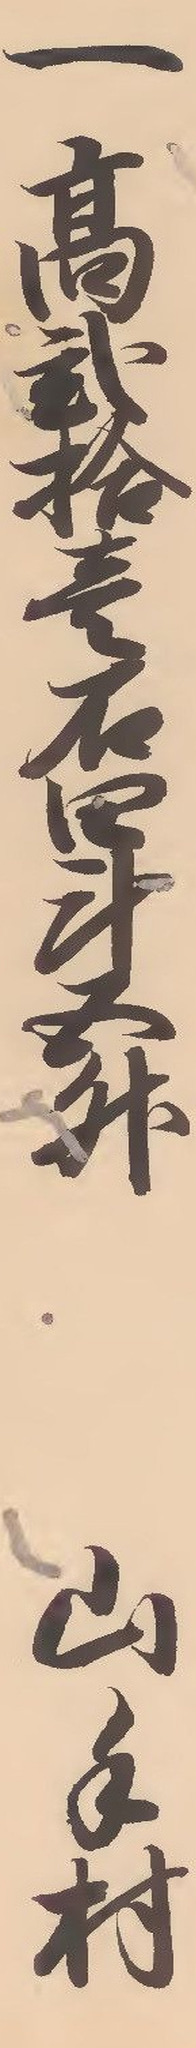一高弐拾壱石四斗五升山手村

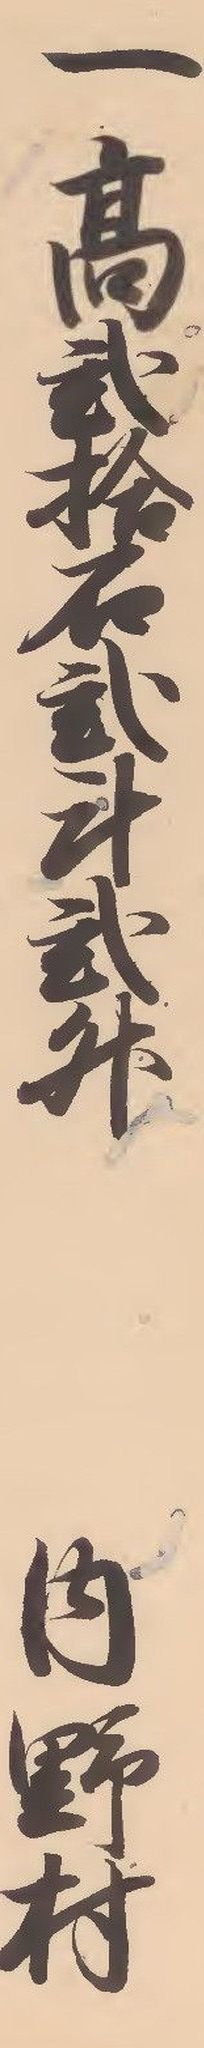一高弐拾石弐斗弐升内野村
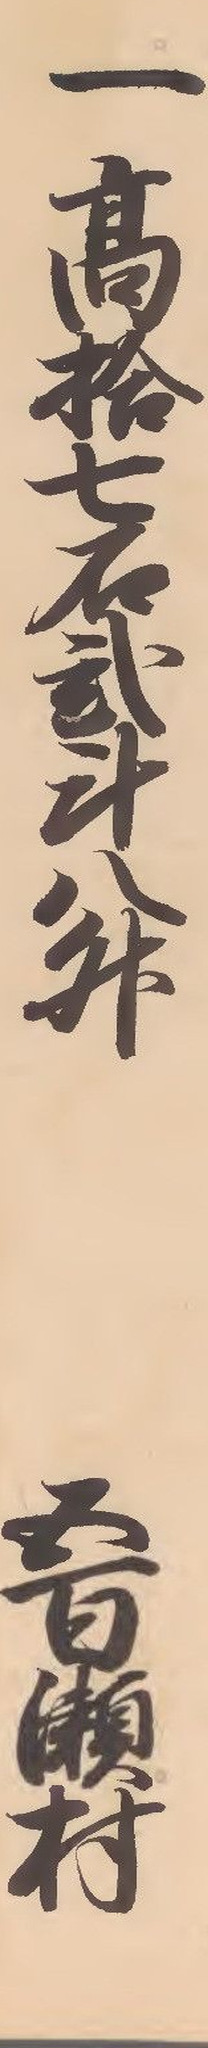一高拾七石弐斗八升五百瀬村
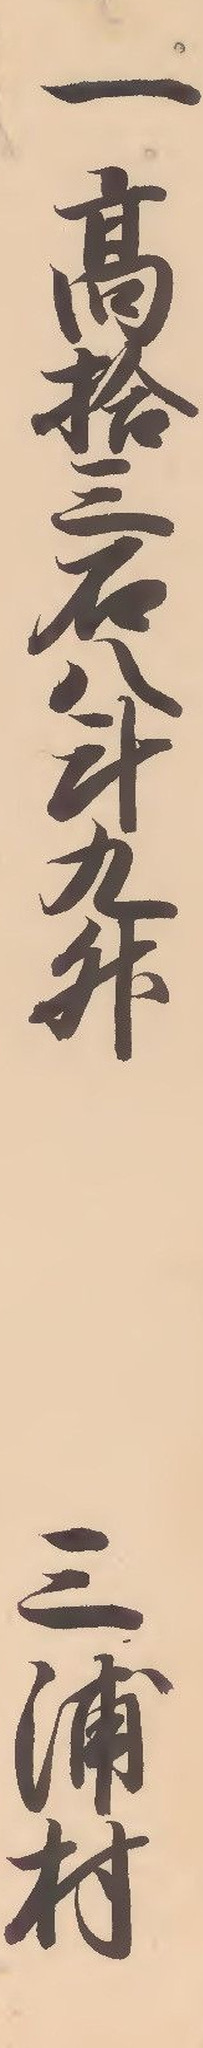一高拾三石八斗九升三浦村
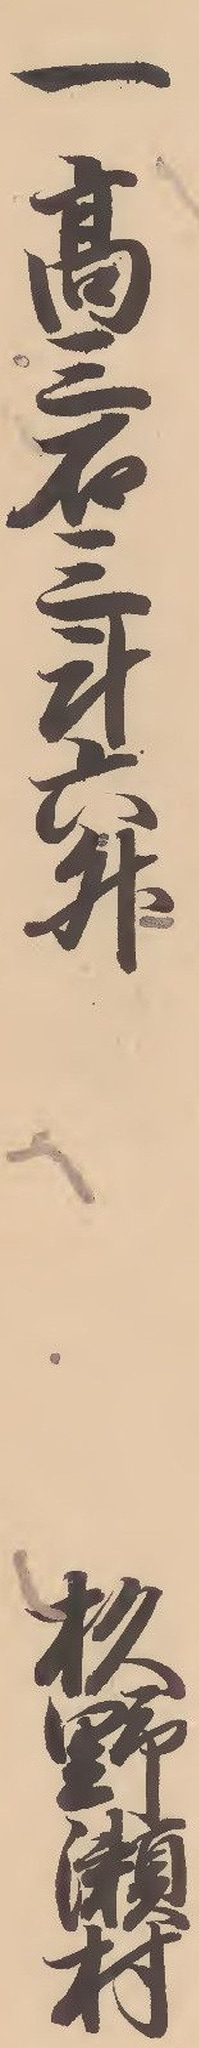一高三石三斗六升杉野瀬村

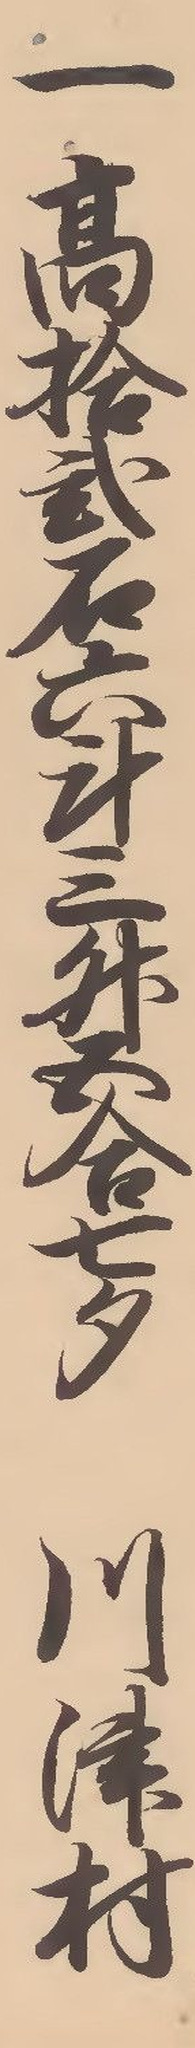一高拾弐石六斗三升五合七勺川津村

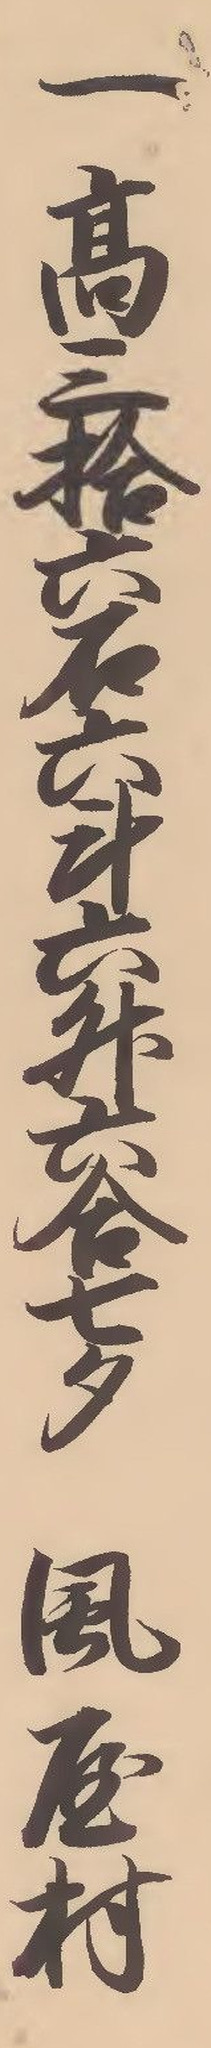一高三拾六石六斗六升六合七勺風屋村
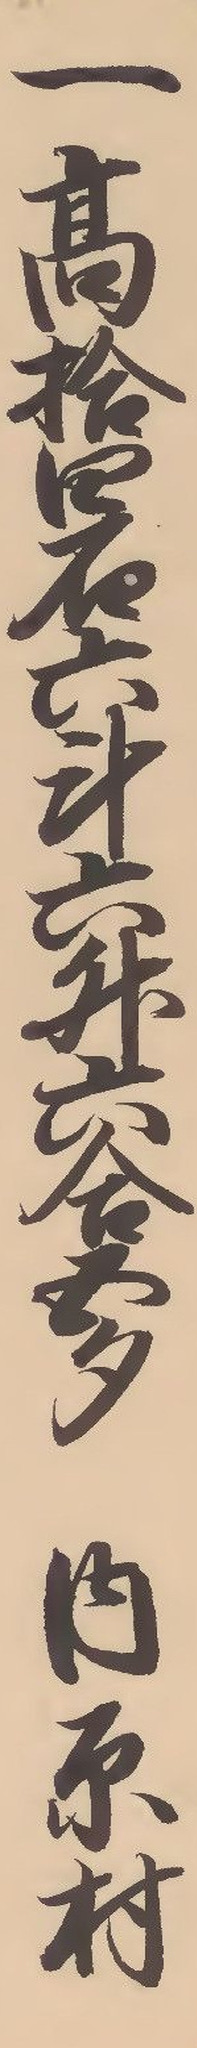一高拾四石六斗六升六合五勺内原村

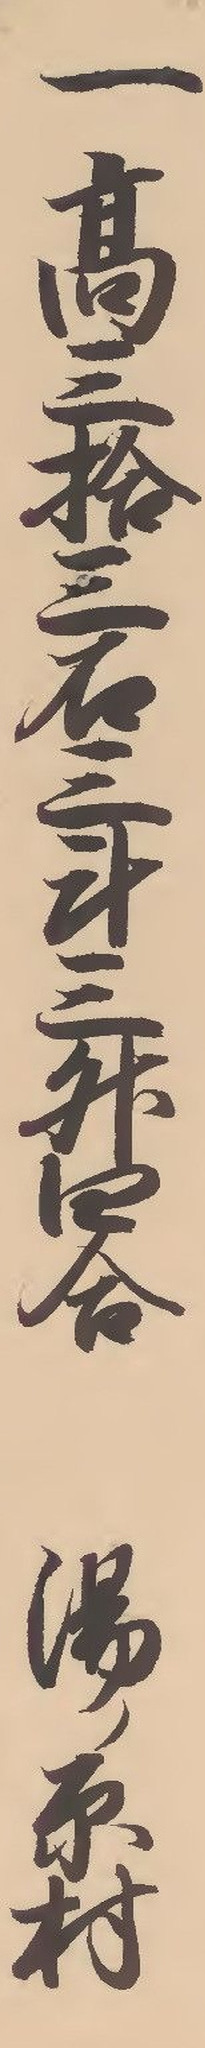一高三拾三石三斗三升四合湯ノ原村
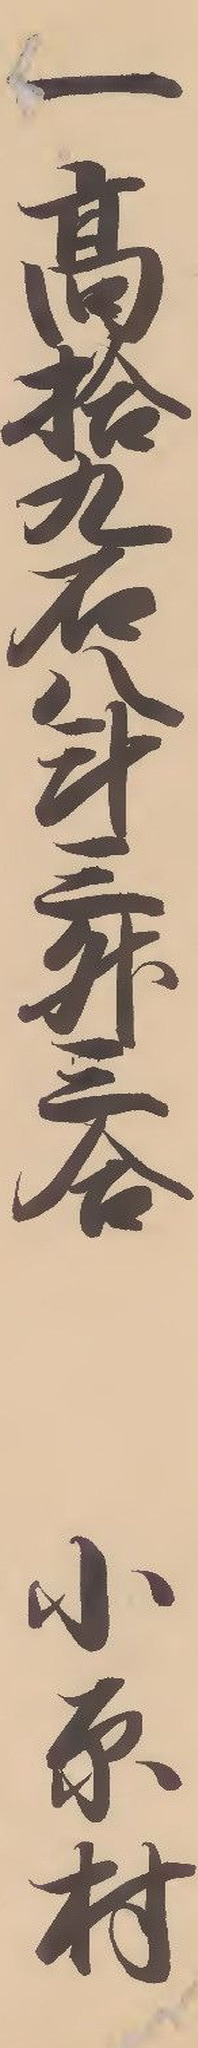一高拾九石八斗三升三合小原村
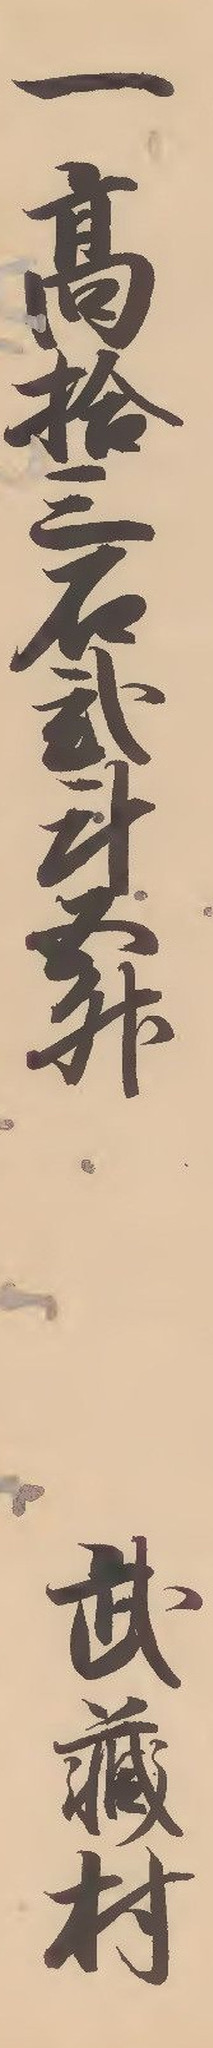一高拾三石弐斗五升武蔵村

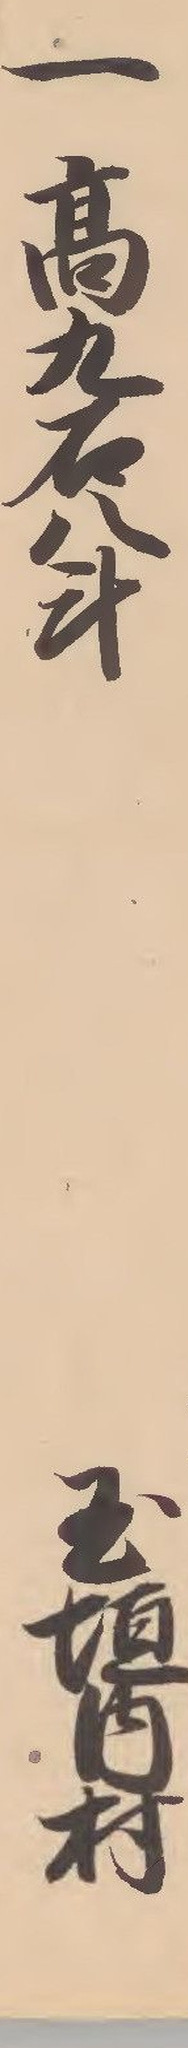一高九石八斗長井村
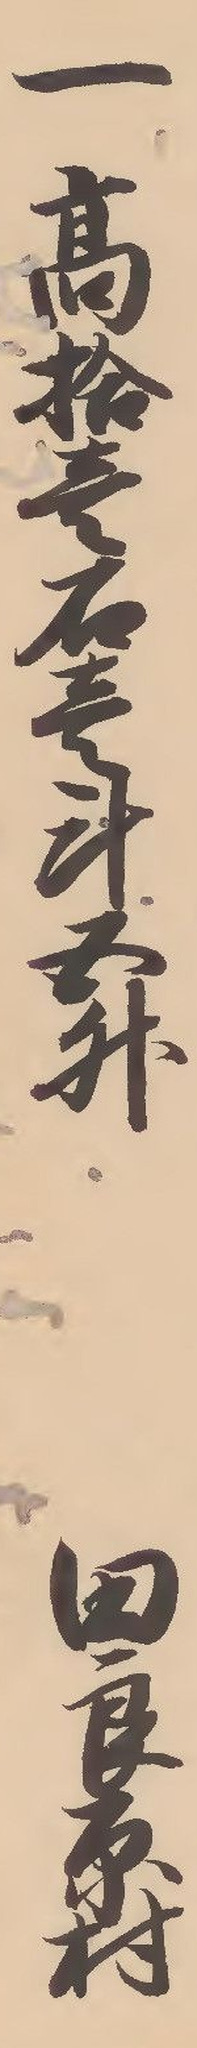一高拾壱石壱斗五升田良原村

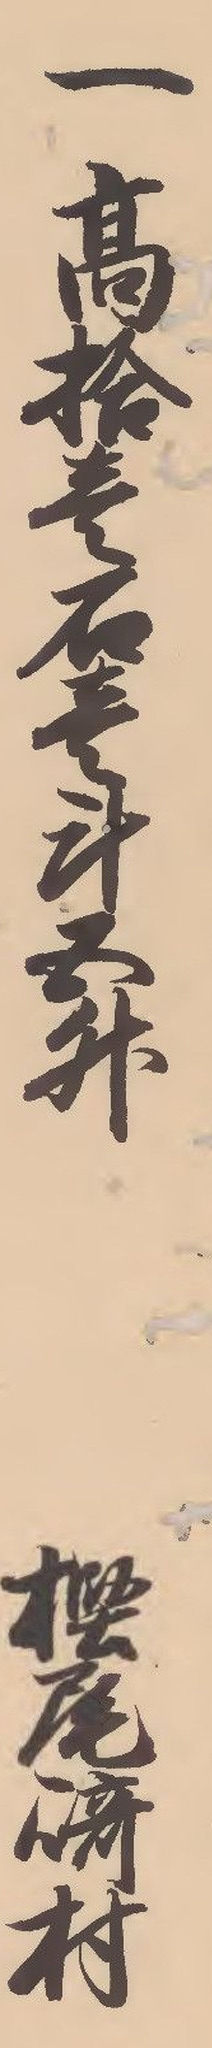一高拾壱石壱斗五升樫尾崎村
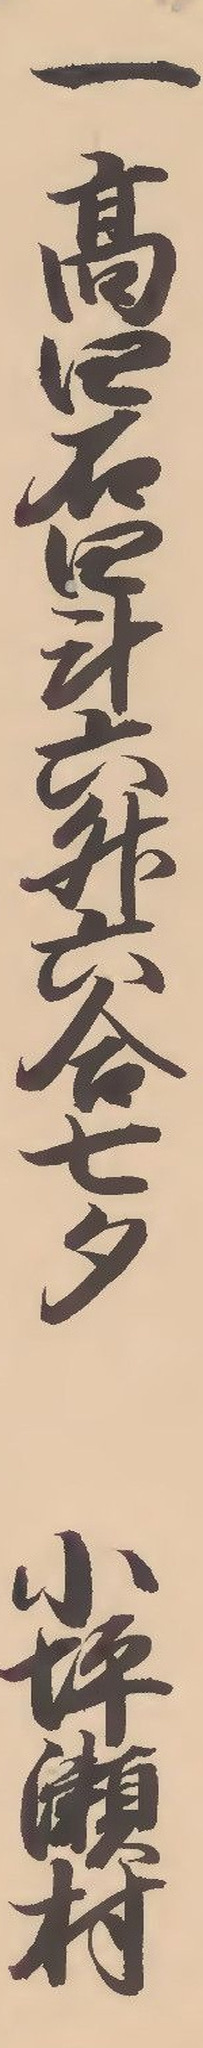一高四石四斗六升六合七勺小坪瀬村
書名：大和国郷帳
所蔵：国立公文書館 National Archives of Japan
